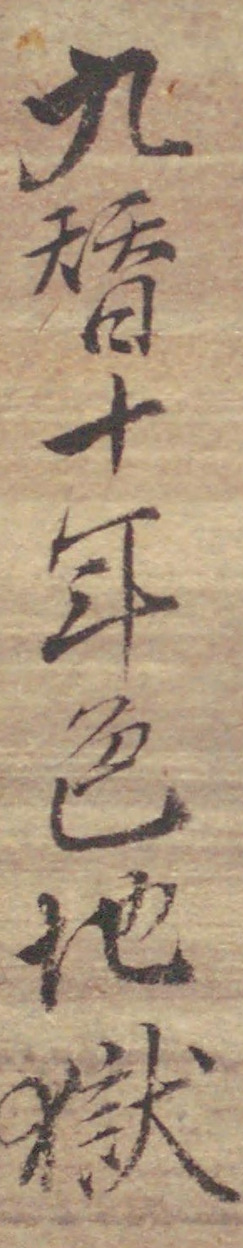九替十年色地獄完

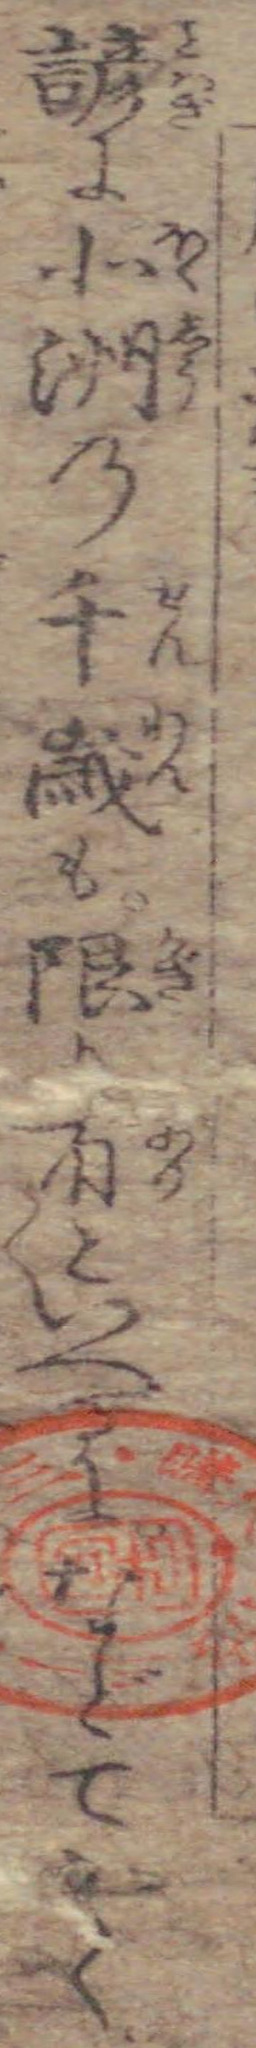諺に北洲の千歳も。限り有といへるに。などてかく。
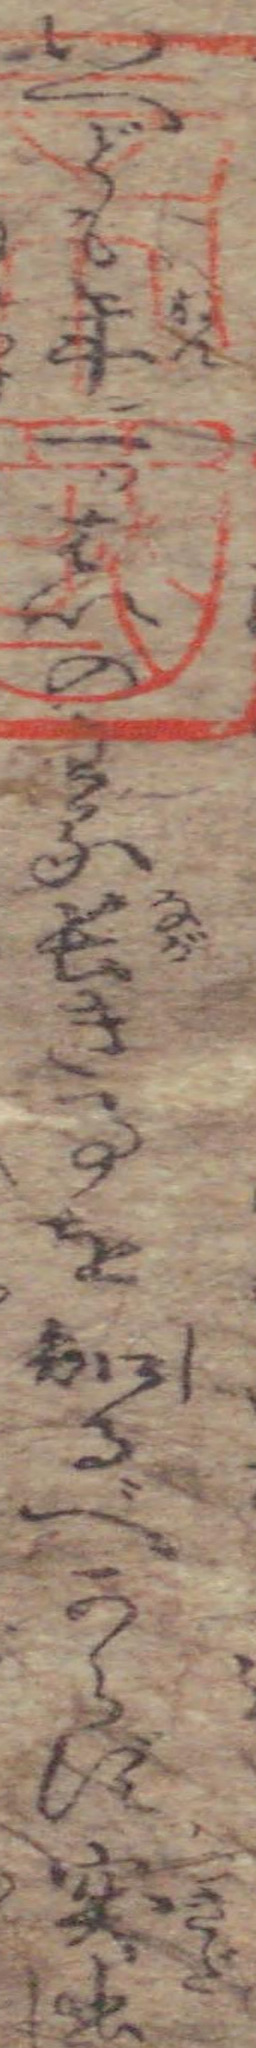いへども。年ン一しのわる長き事を知るべからず。突出し
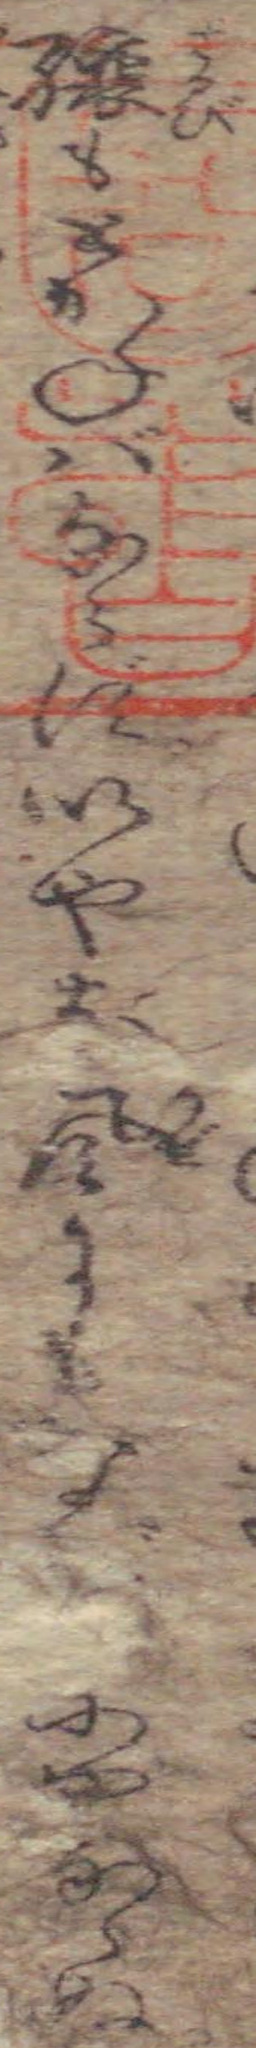驤もとかねばならず。いやな風にもなびかにやならぬ。
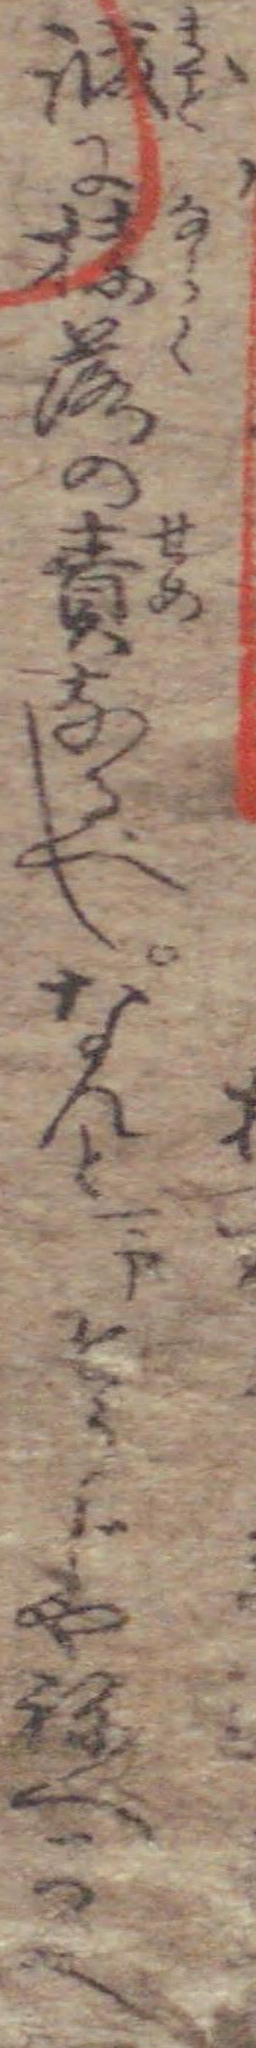誠に㮈楽の責なるべし。なんとマアそうじやねへかへ
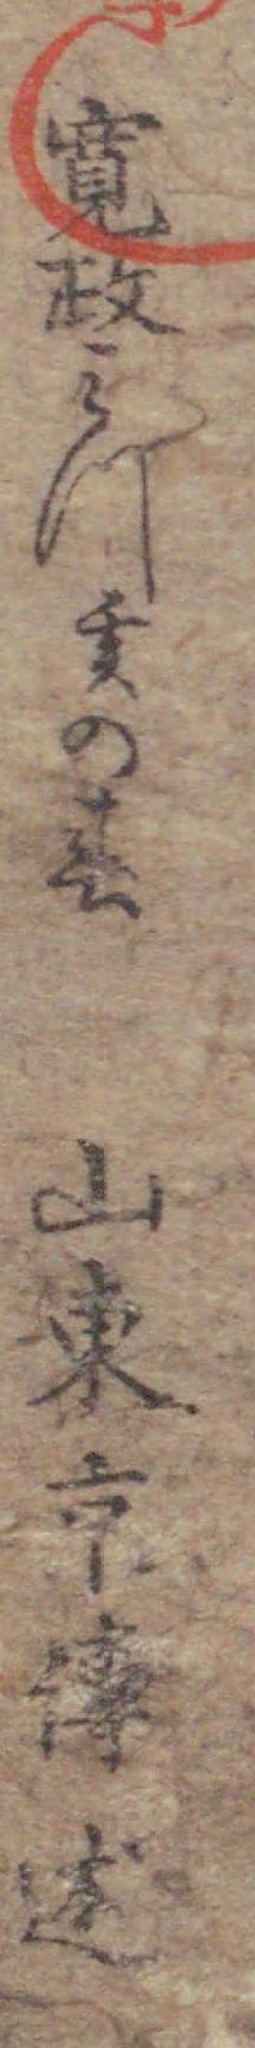寛政しん亥の春山東京伝述

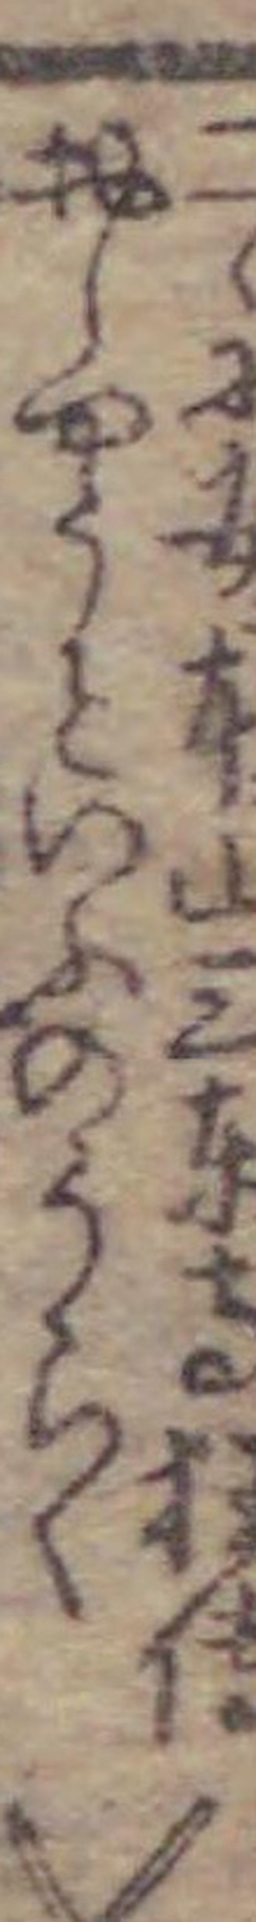おしやうといふのうらく
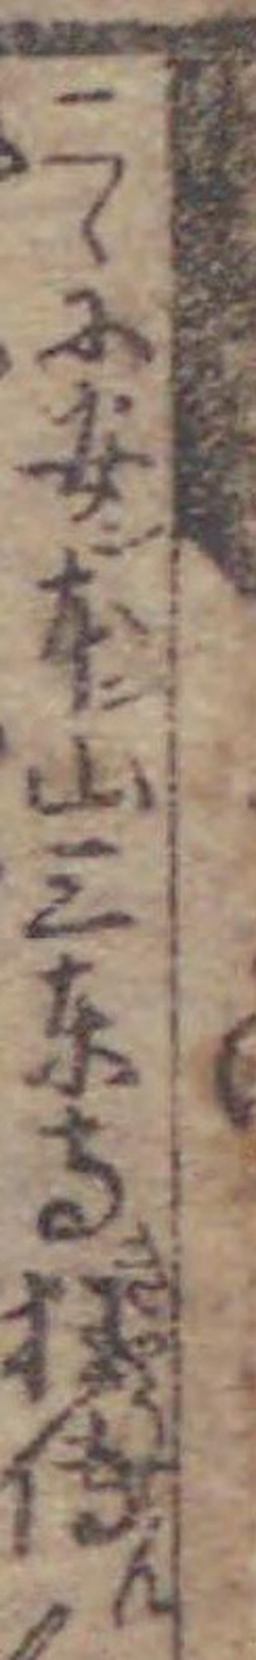こゝに安本山三東寺狂伝
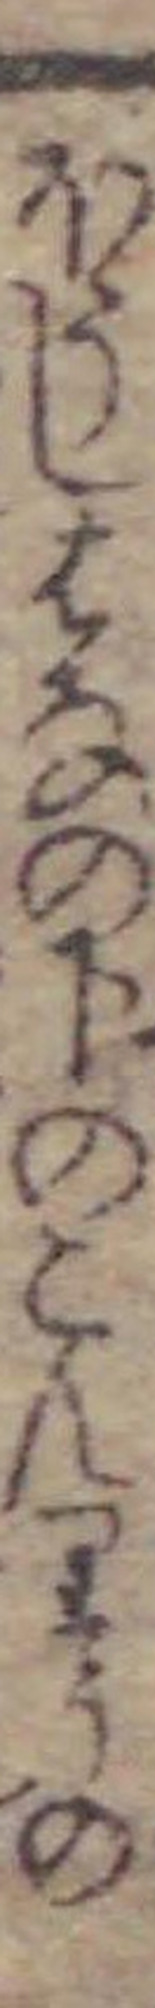ほうしはなの下のこんりうの
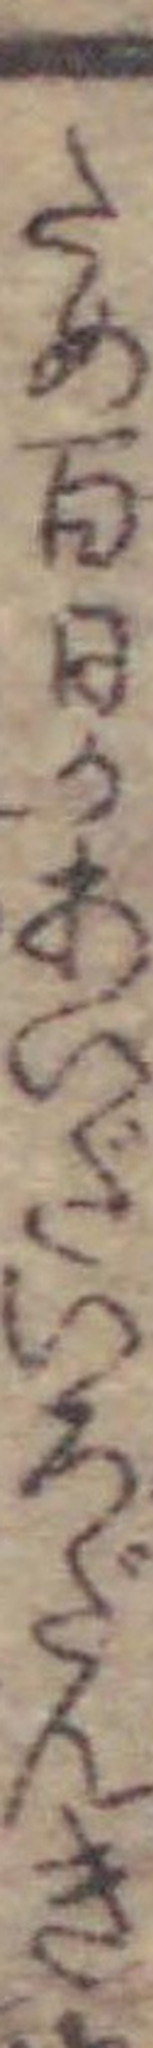ため百日かあいだいろだんき
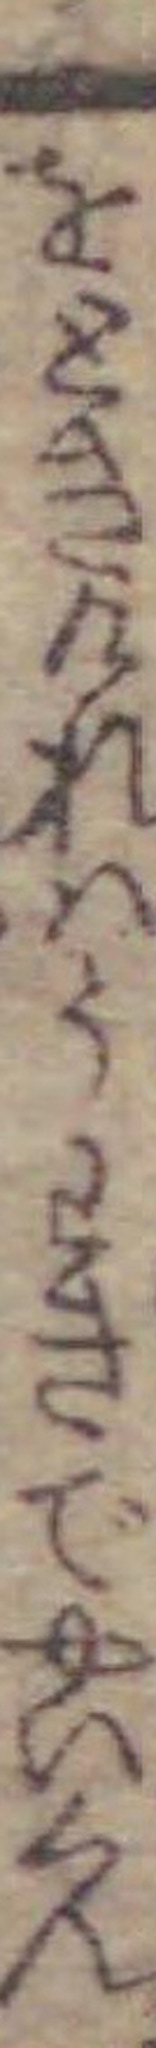をときけれはうわきでやいくん
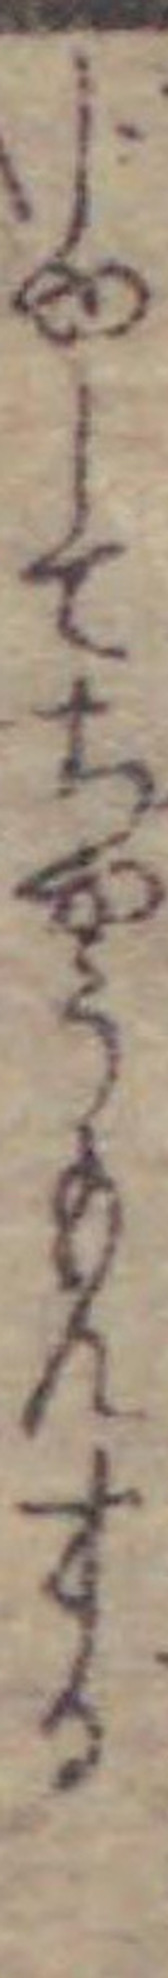じゆしてちやうもんする
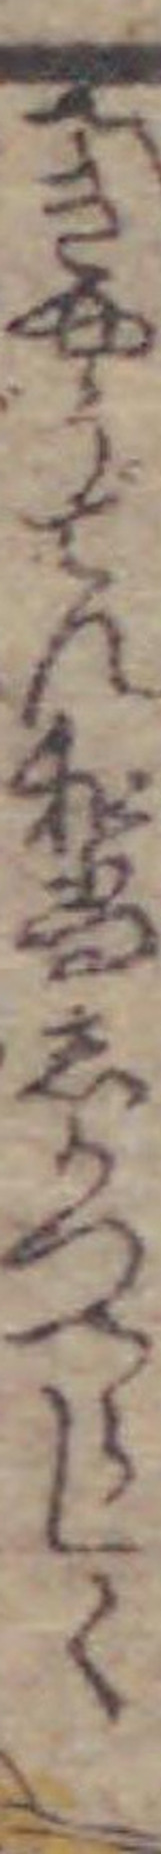「きやうでん和尚しかつへらしく
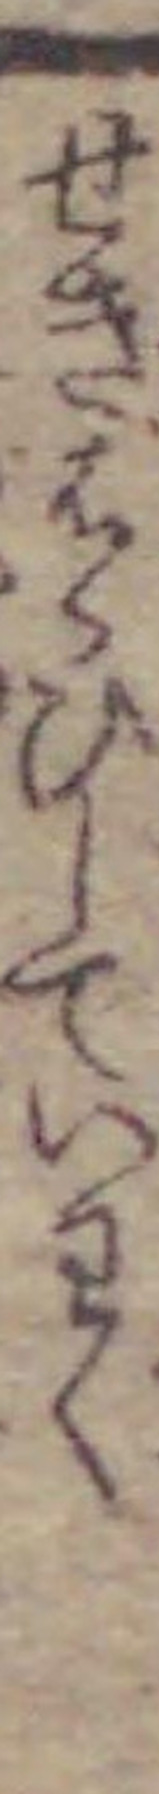せきばらひしていわく
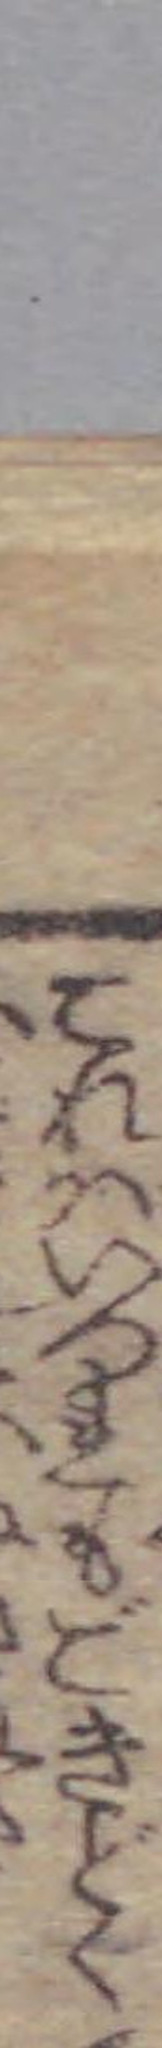これはいつれもごきどく
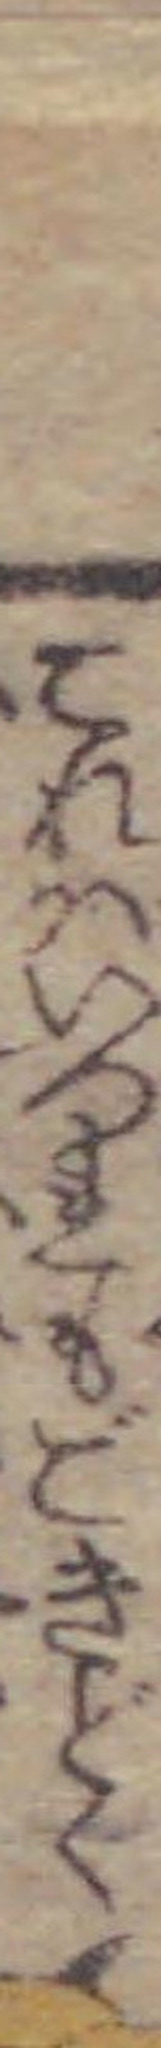これはいつれもごきどく
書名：九替十年色地獄 : 3巻
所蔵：国立国会図書館 National Diet Library, JAPAN
